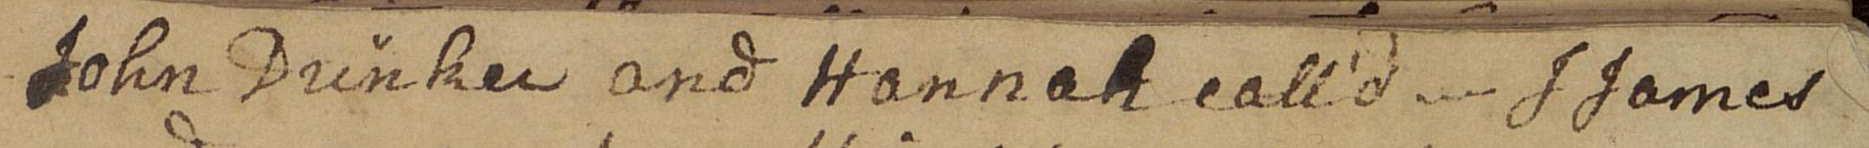John Drinker and Hannah call'd- J James
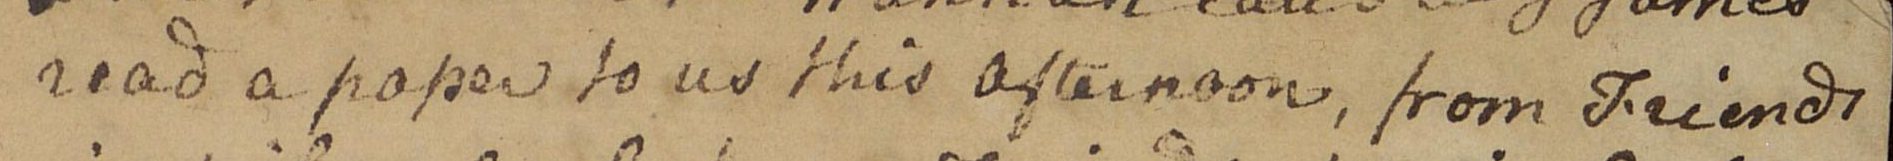read a paper to us this afternoon, from Friends
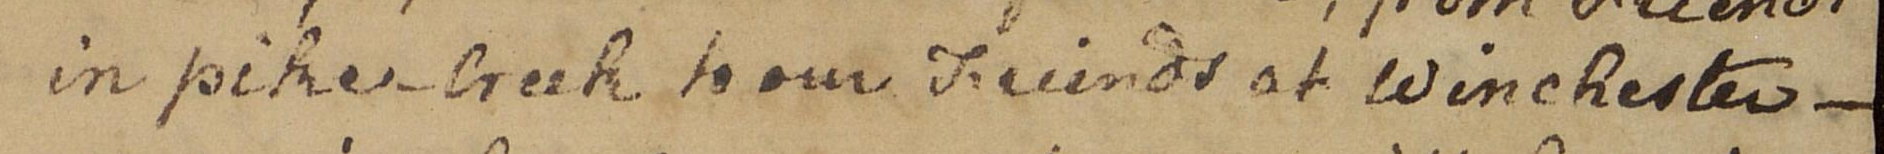in pike-Creek to our Friends at Winchester-
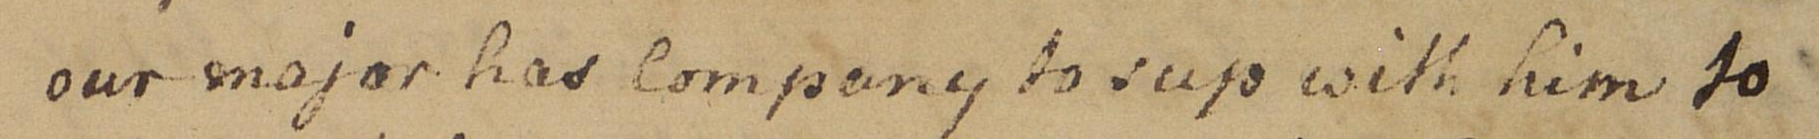our major has Company to sup with him to
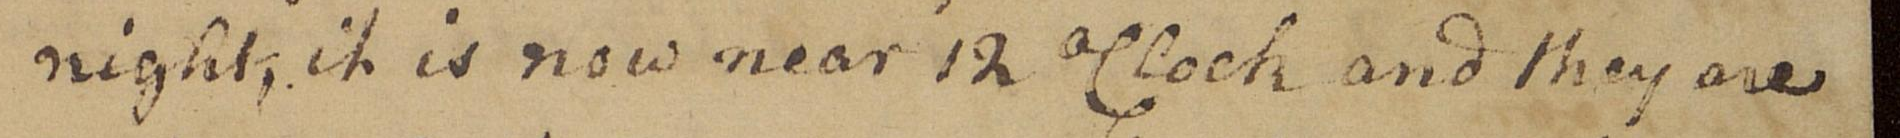night, it is now near 12 ^o Clock and they are
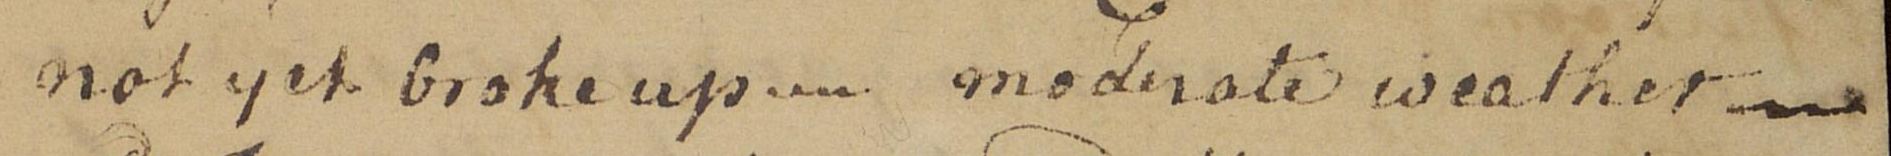not yet broke up- moderate weather-
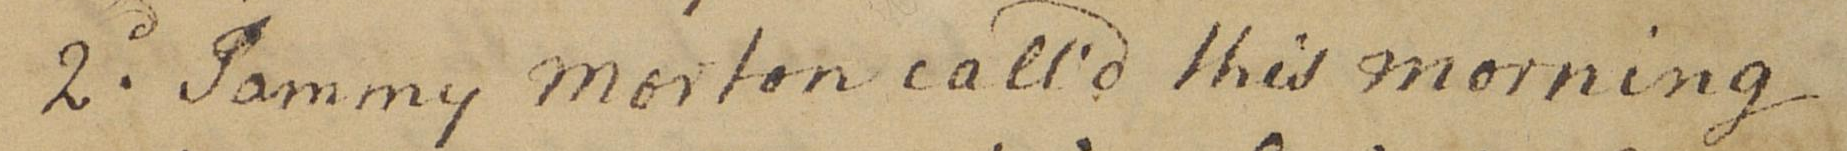2^d. Sammy Morton call'd this morning
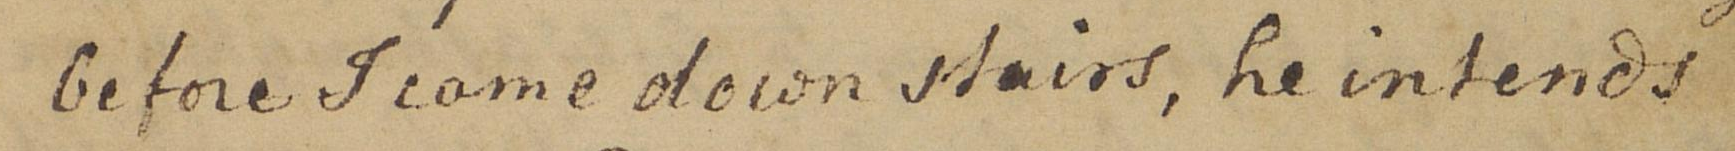before I came down stairs, he intends
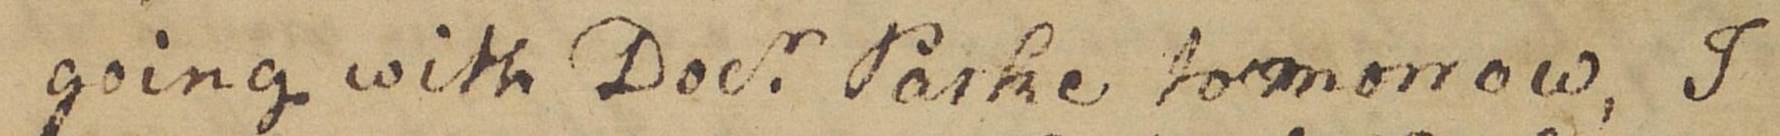going with Doc^r. Parke tomorrow, I
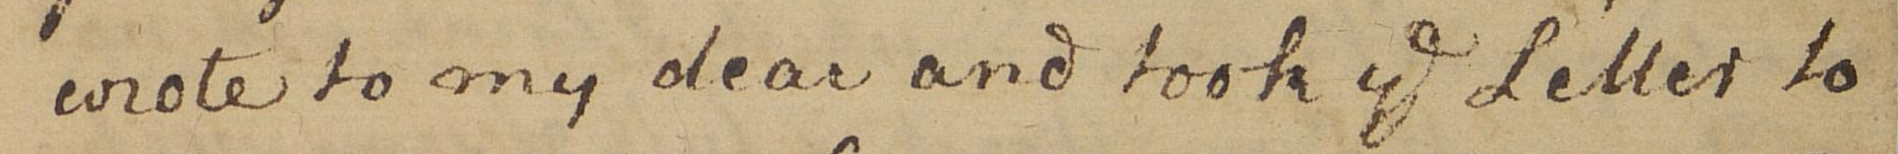wrote to my dear and took y^e Letter to
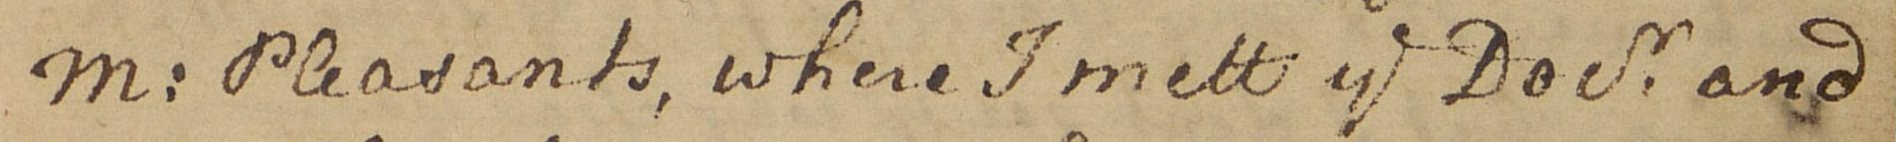M: Pleasants, where I mett y^e Doc^r. and
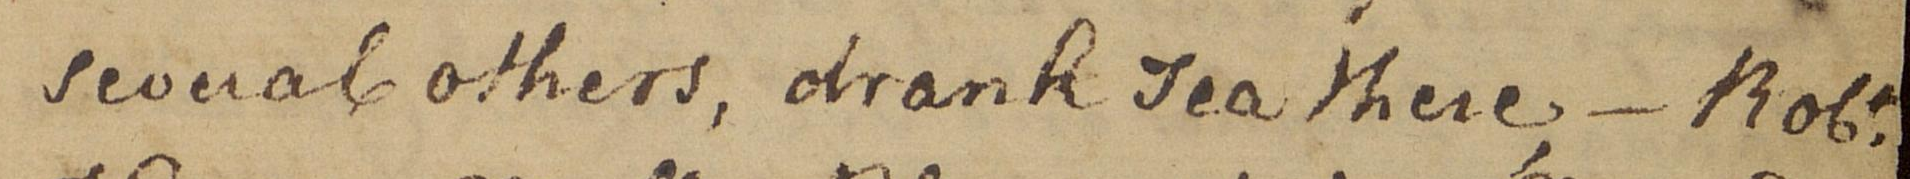several others, drank Tea there- Rob^t.
